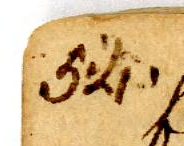54
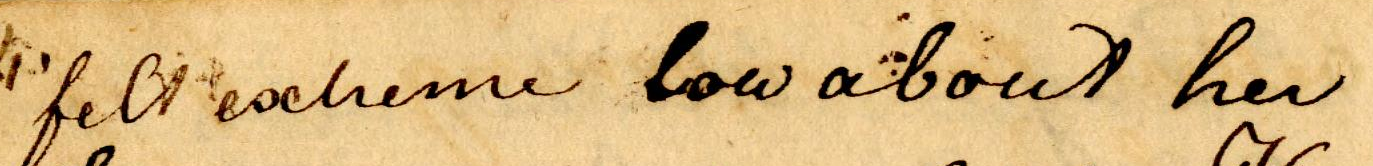felt extreme low about her
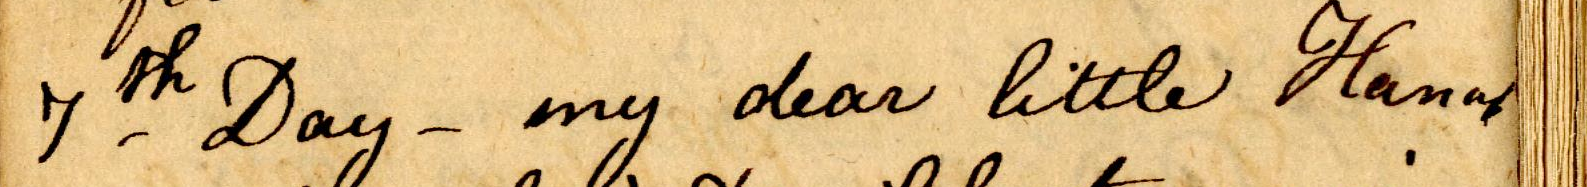7^th Day- my dear little Hanah
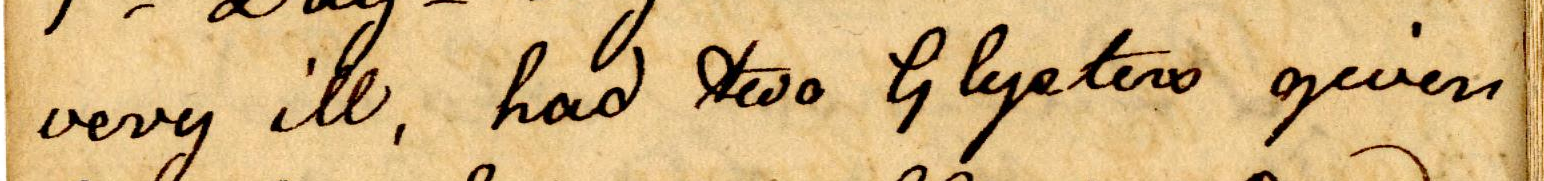very ill, had two Glysters given
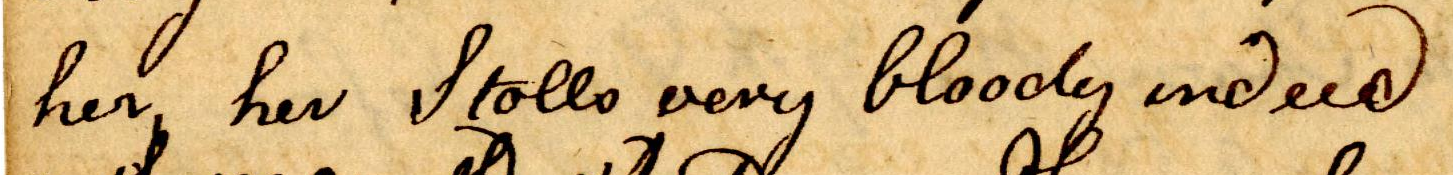her, her Stolls very bloody indeed
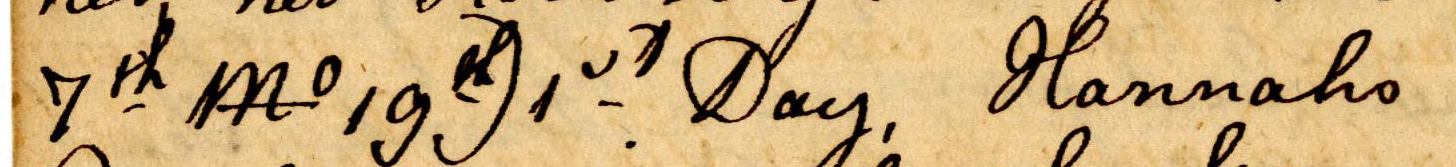7^th M^o 19^th) 1^st Day, Hannahs
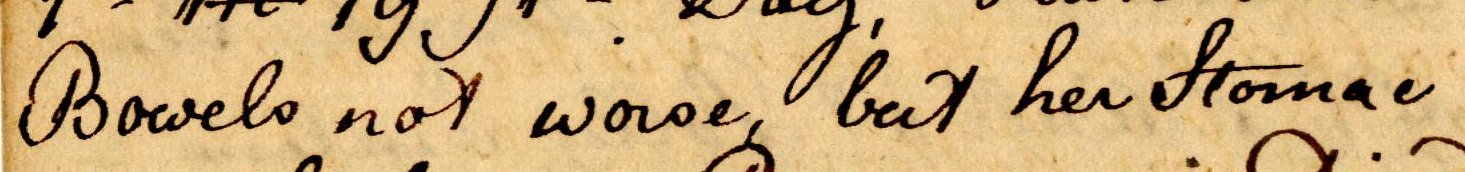Bowels not worse, but her Stomac
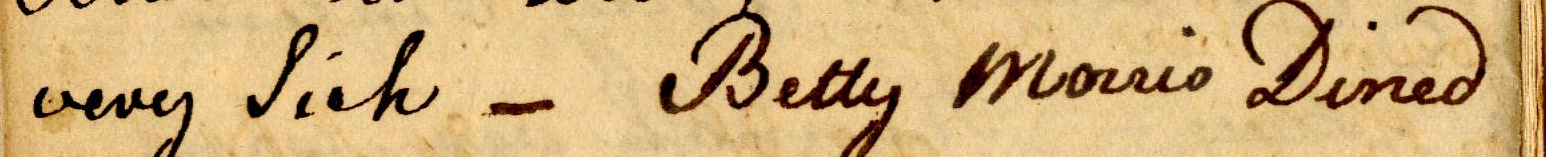very Sick- Betty Morris Dined
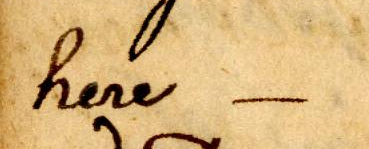here-
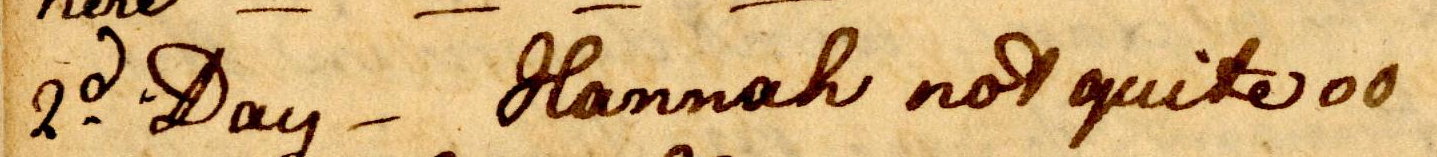2^d Day- Hannah not quite so
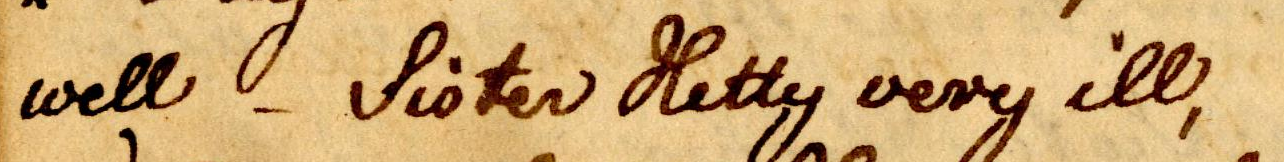well - Sister Hetty very ill
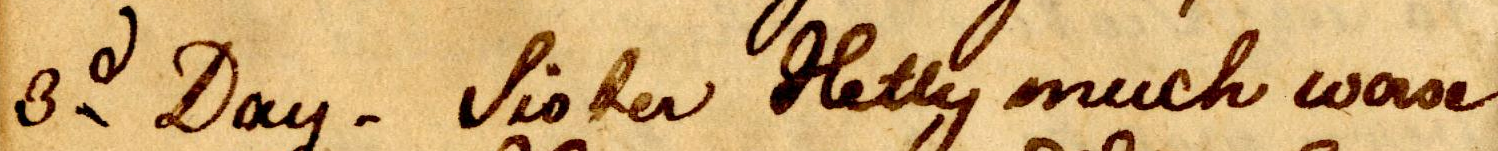3^d Day- Sister Hetty much worse
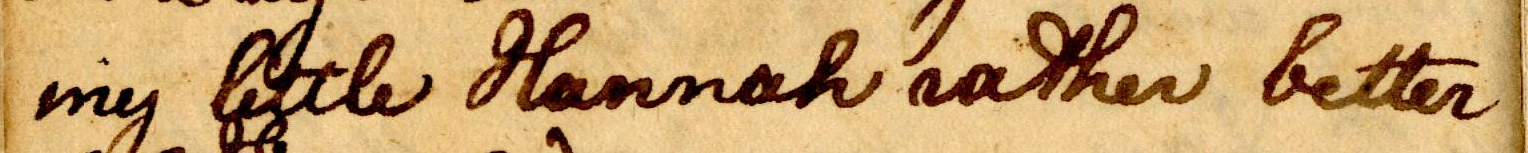my little Hannah rather better
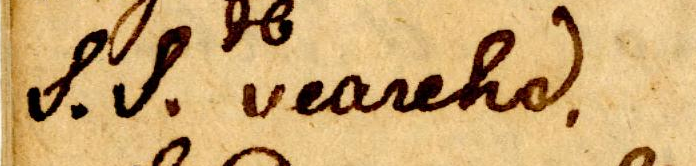S.S. searchd.
